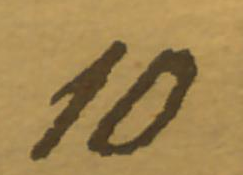10
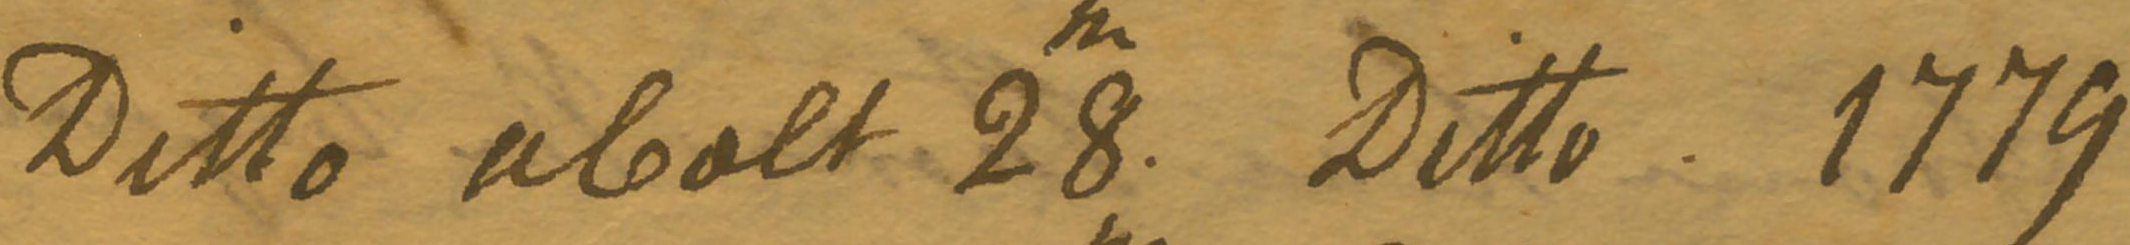Ditto a Colt 28^th. Ditto. 1779
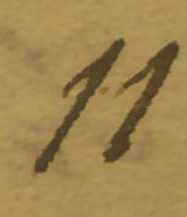11
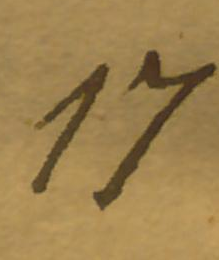17
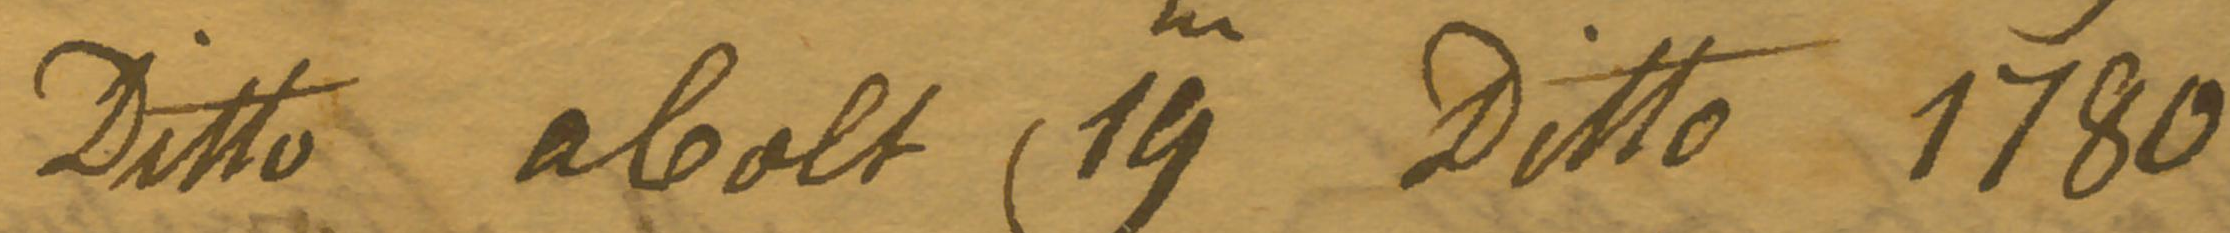Ditto a Colt19^th Ditto 1780
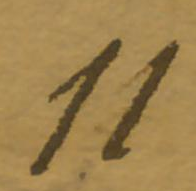11
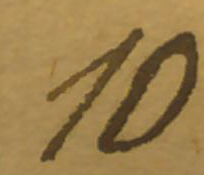10
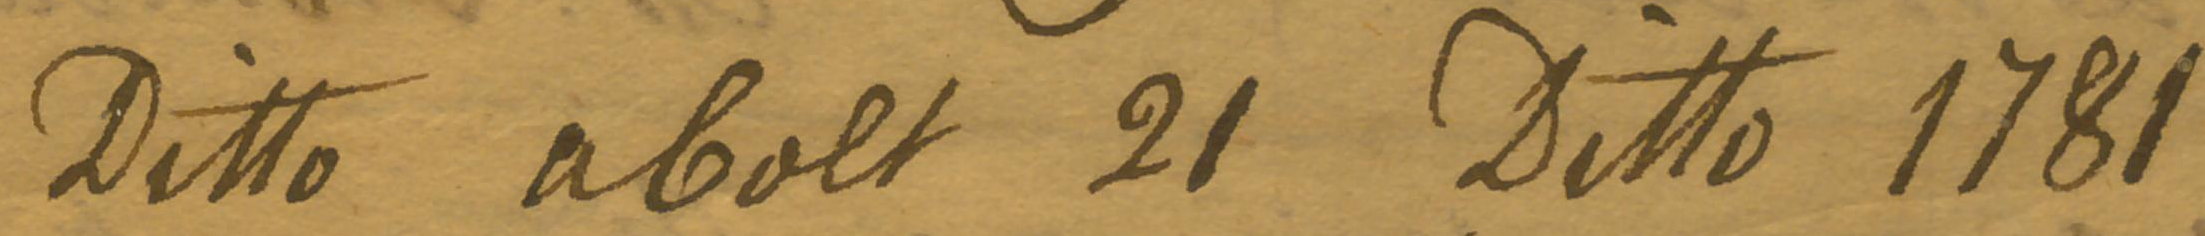Ditto a Colt 21 Ditto 1781
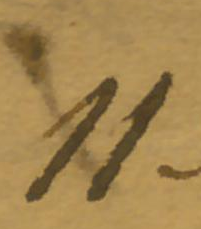11
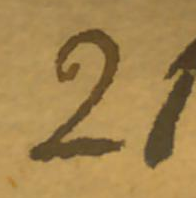21
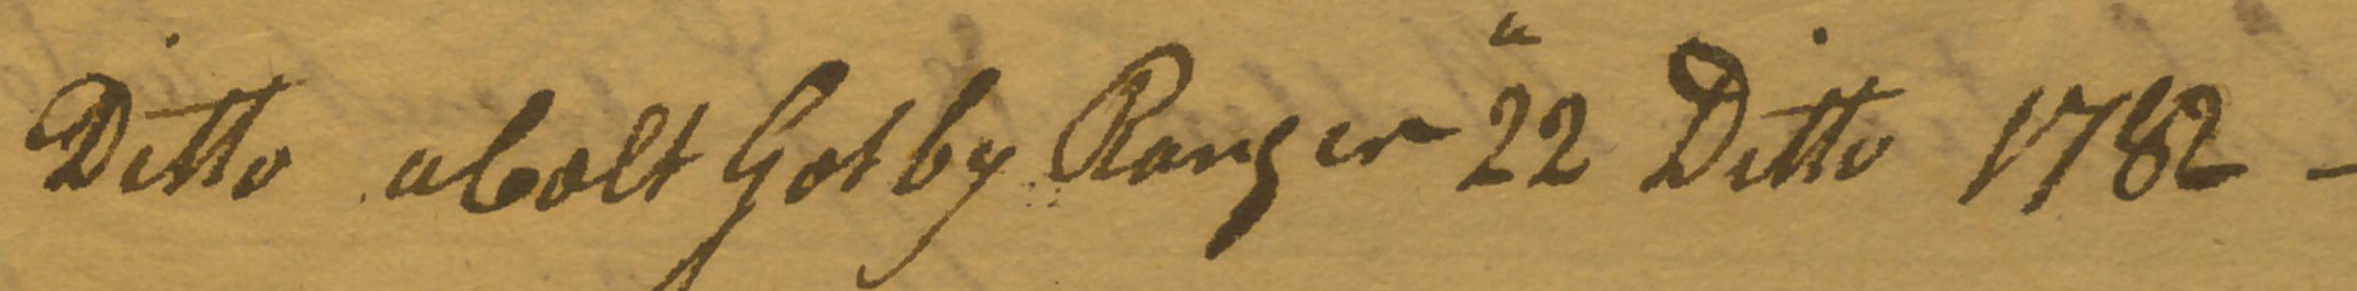Ditto a Colt Golby Ranger 22 Ditto 1782
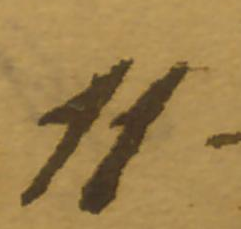11
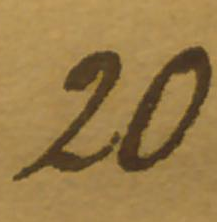20
